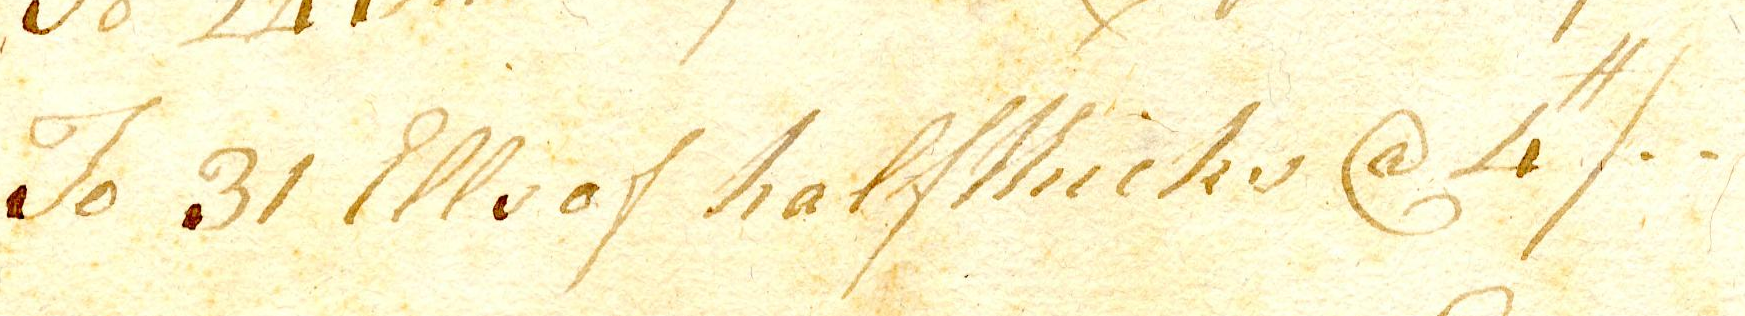To 31 Ells of halfwhicks @ 4s
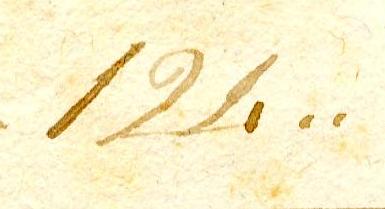124..
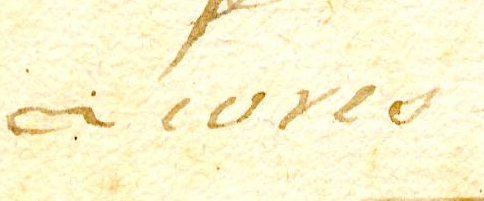Livres
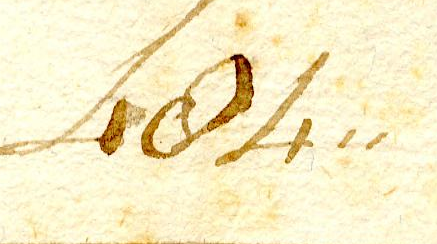404..
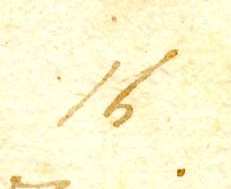16
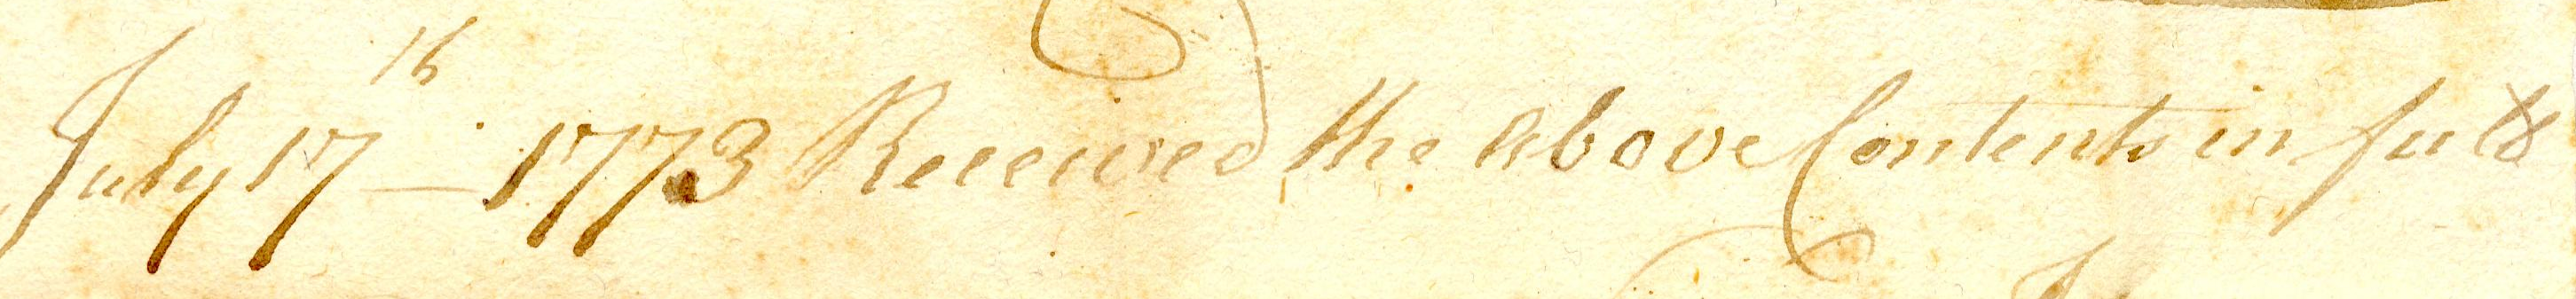July 17 1773 Received the above contents in full
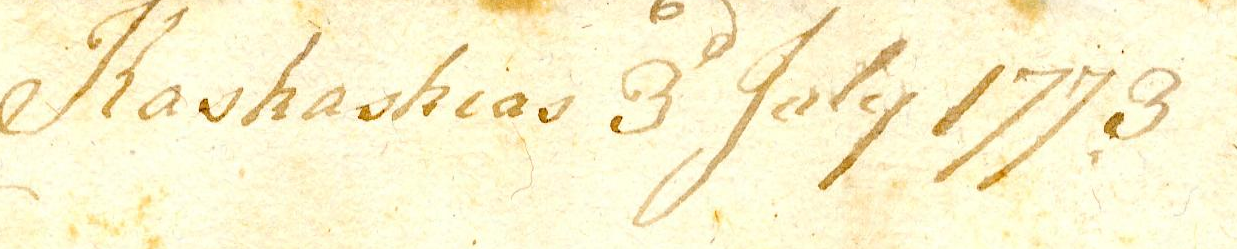Kashaskias 3^d July 1773
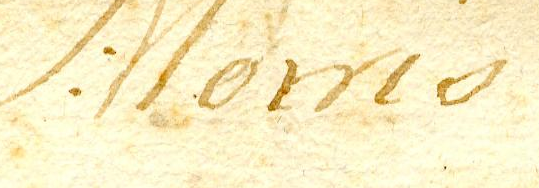Morris
